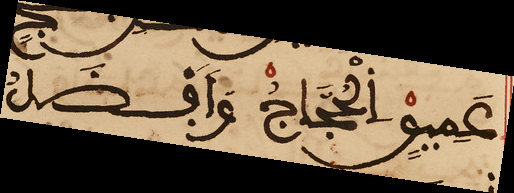عميق الحجاج و أفضل
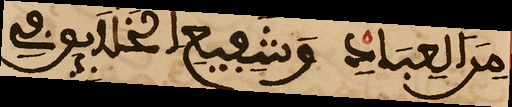من العباد و شفيع الخلائق في
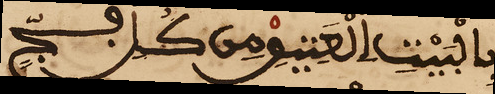بالبيت العتيق من كل فج
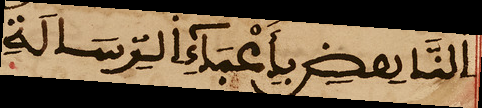الناهض باعباء الرسالة
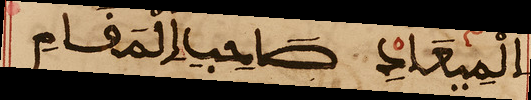الميعاد صاحب المقام
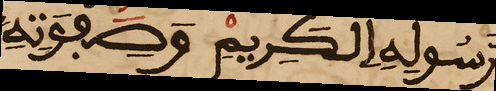رسوله الكريم و صفوته
